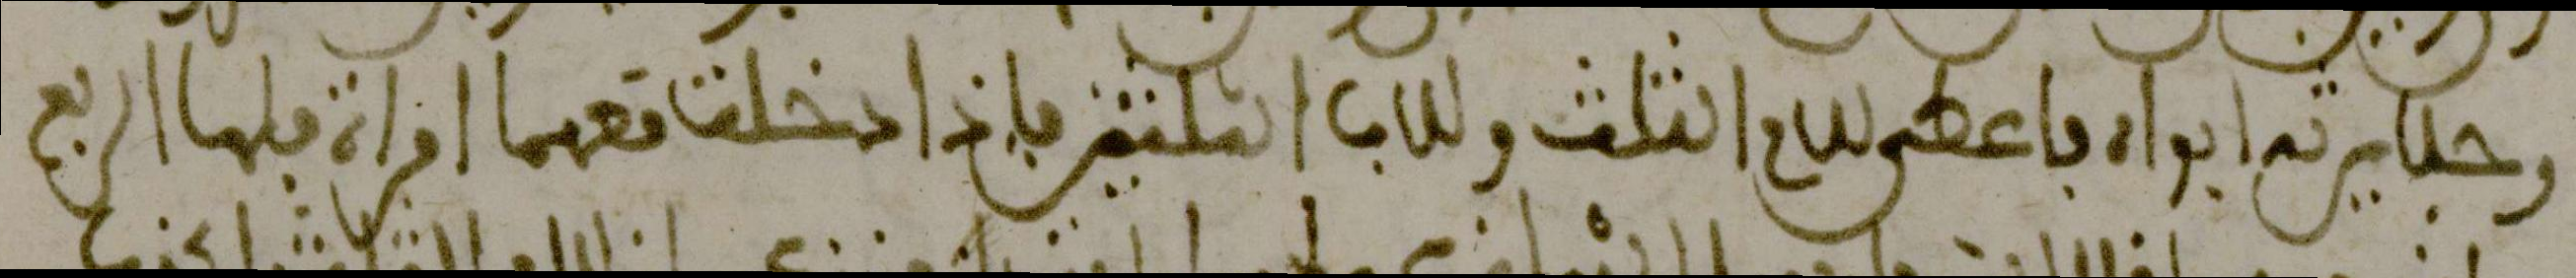رجلا يرثه ابواه فاعطى للام الثلث وللاب الثلثين فاذا دخلت معهما امراة فلها الربع
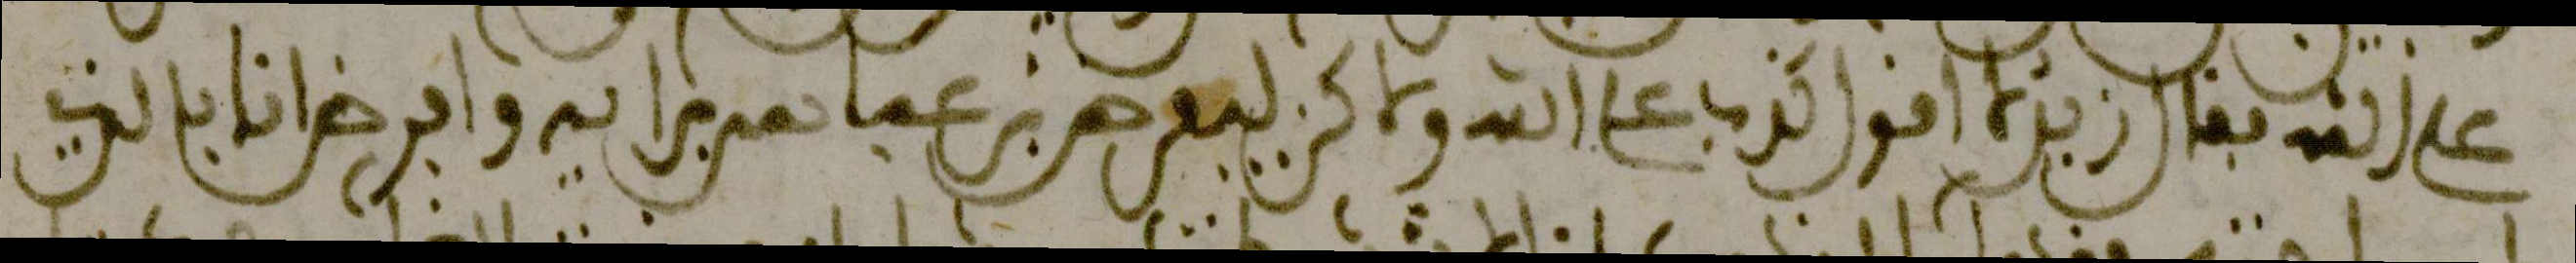على الله فقال زيد لا اقول كذب على الله ولاكن ليفرض بن عباس برايه وافرض انا بالذي
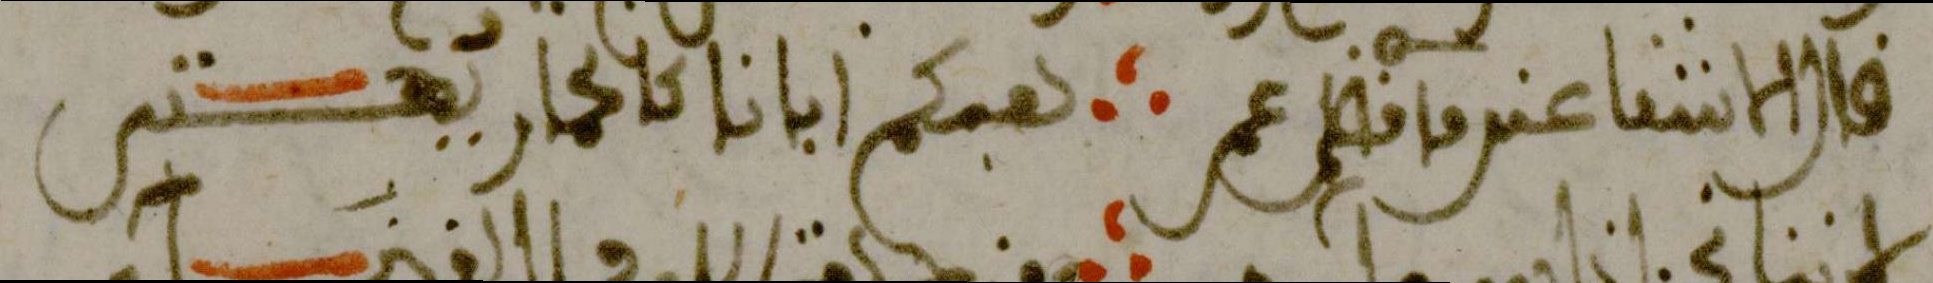قال الاشقا عند ما قضى عمر هبكم ابانا كالحمار يعتبر
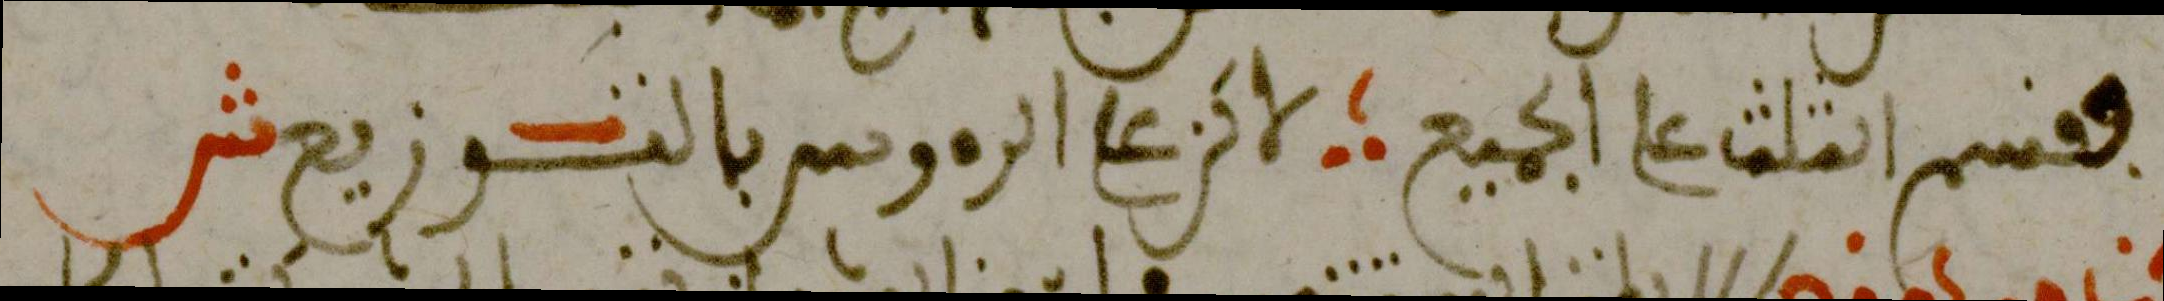فقسم الثلث على الجميع لاكن على الرءوس بالتوزيع ش
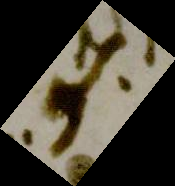بو
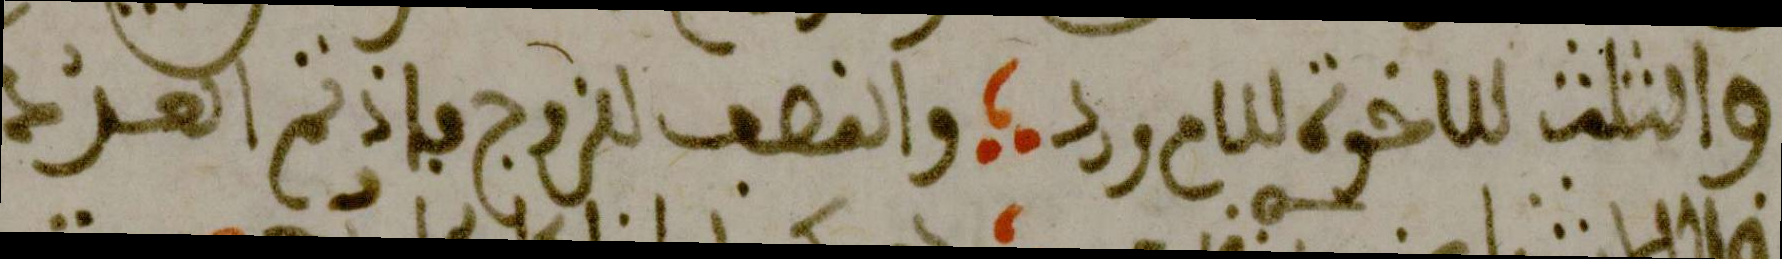والثلث للاخوة للام ورد النصب للزوج فاذتم العدد
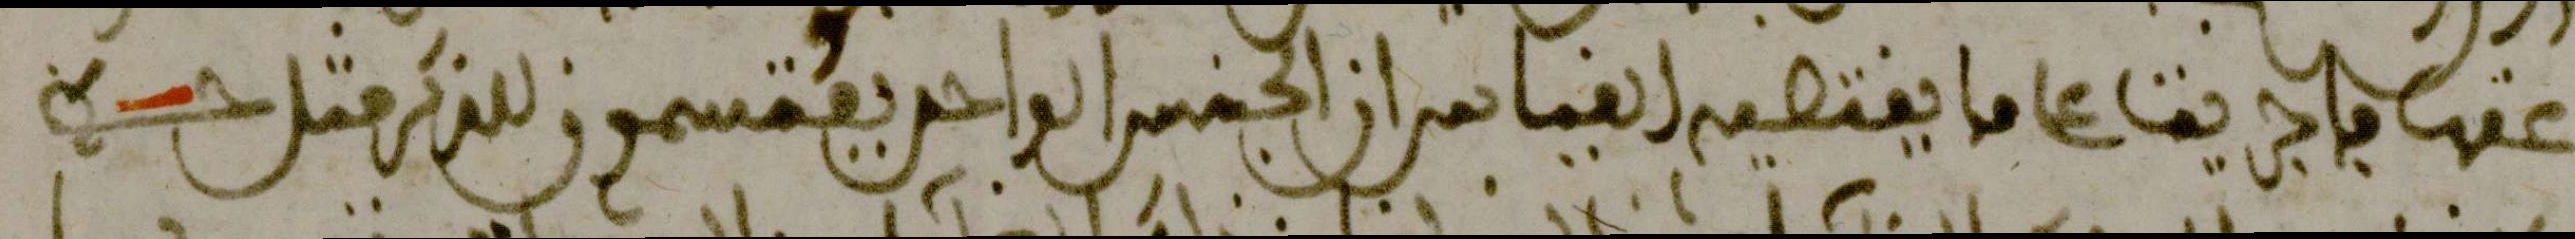عنها فاجريت على ما يقتضيه القياس ان الجنس الواحد يقتسمون للذكر مثل حَظ
